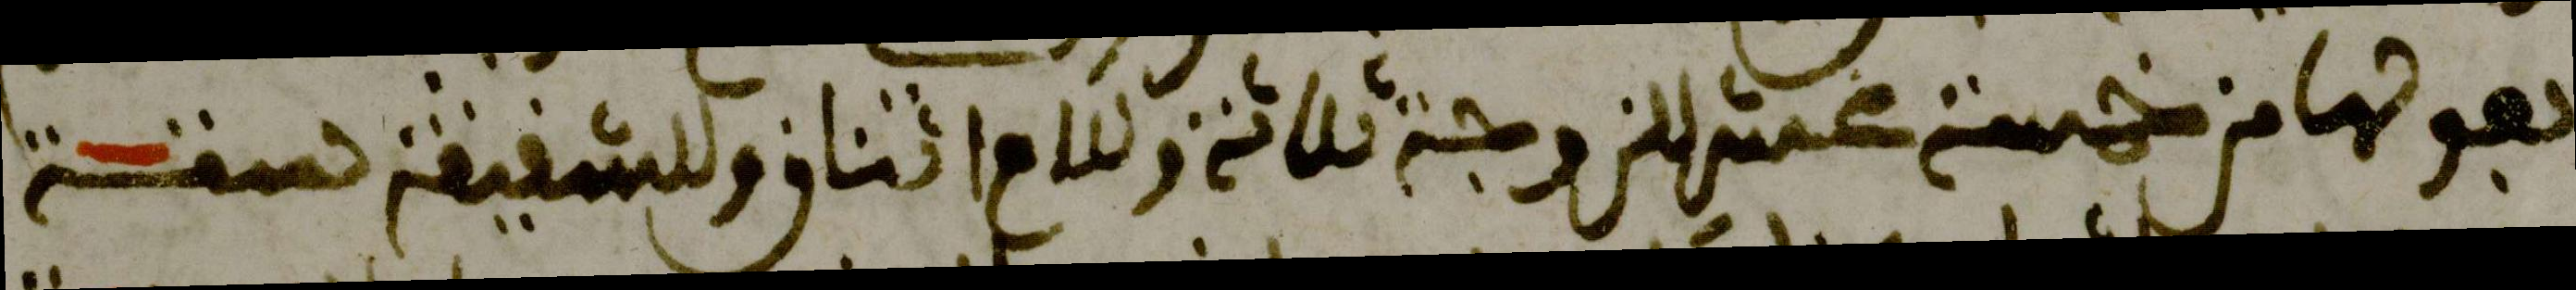بعولها من خمسة عشر للزوجة ثلاثة وللام اثنان وللشقيقة ستَة
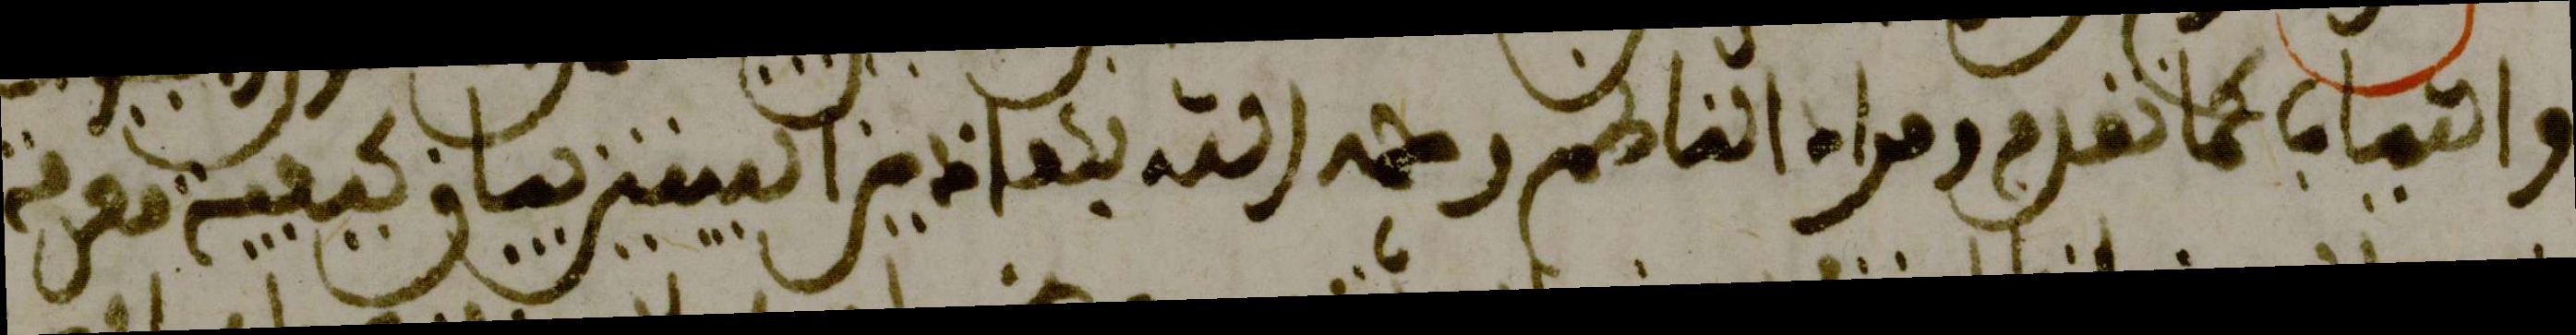والثياب كما تقدم ومراد الناظم رحمه الله بهاذين البيتين بيان كيفية معرفة
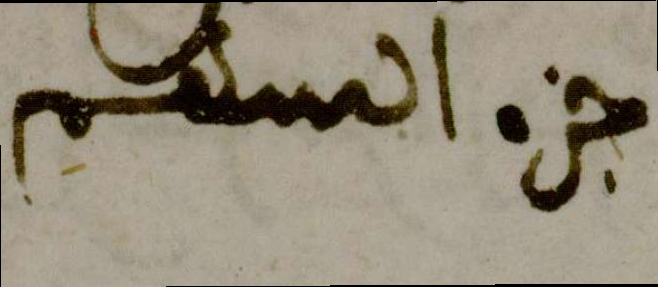جزء السهم
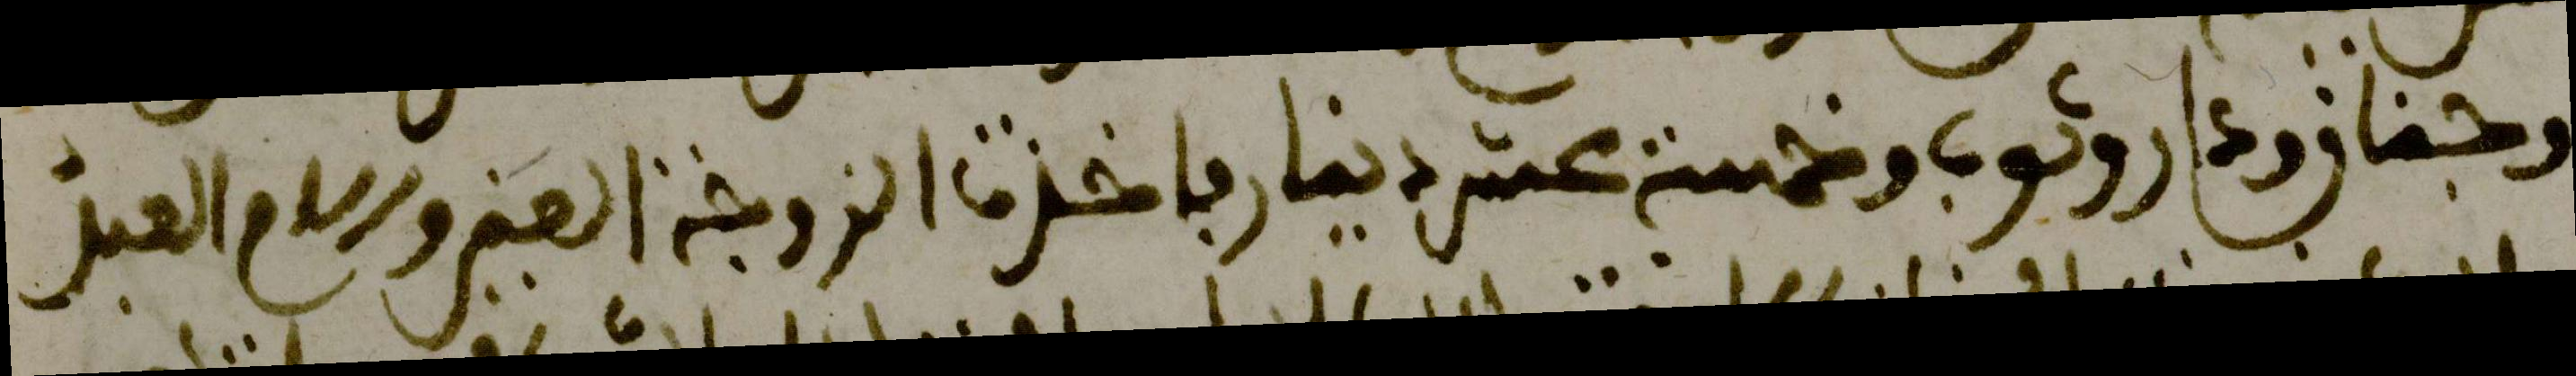وجنان ودار وثوب وخمسة عشر دينار فاخذت الزوجة العين والام العبد
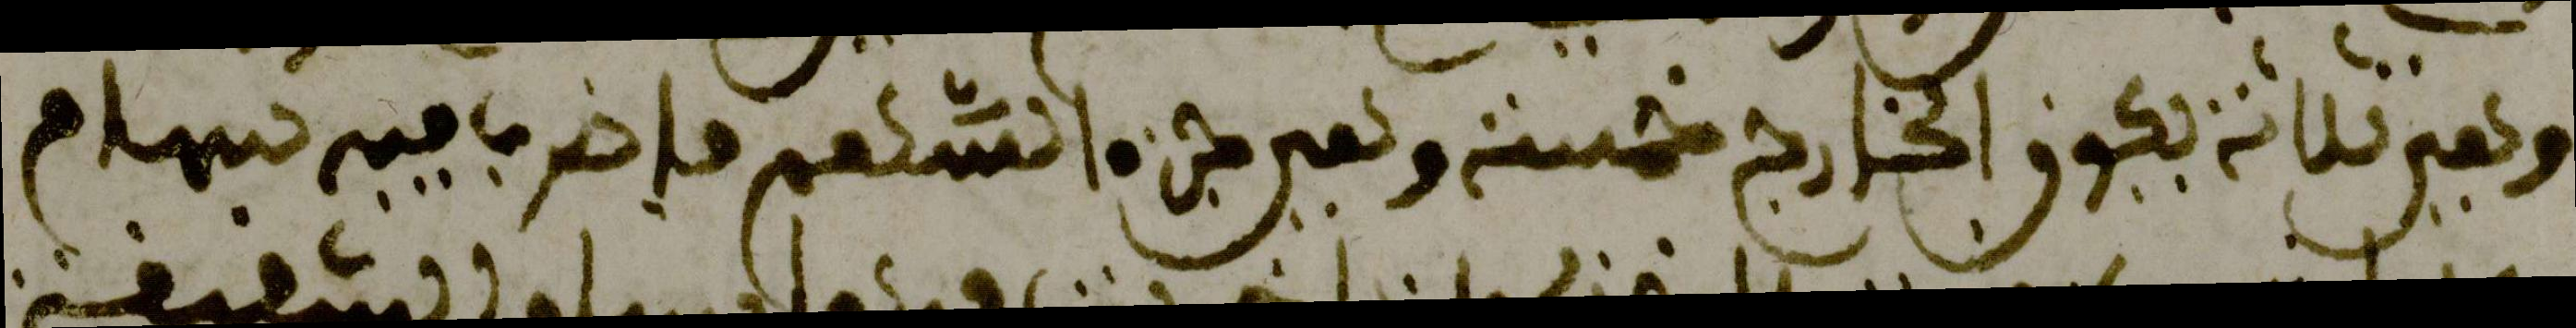وهي ثلاثة يكون الخارج خمسة وهي جزء السَّهم فاضرب فيه سهام
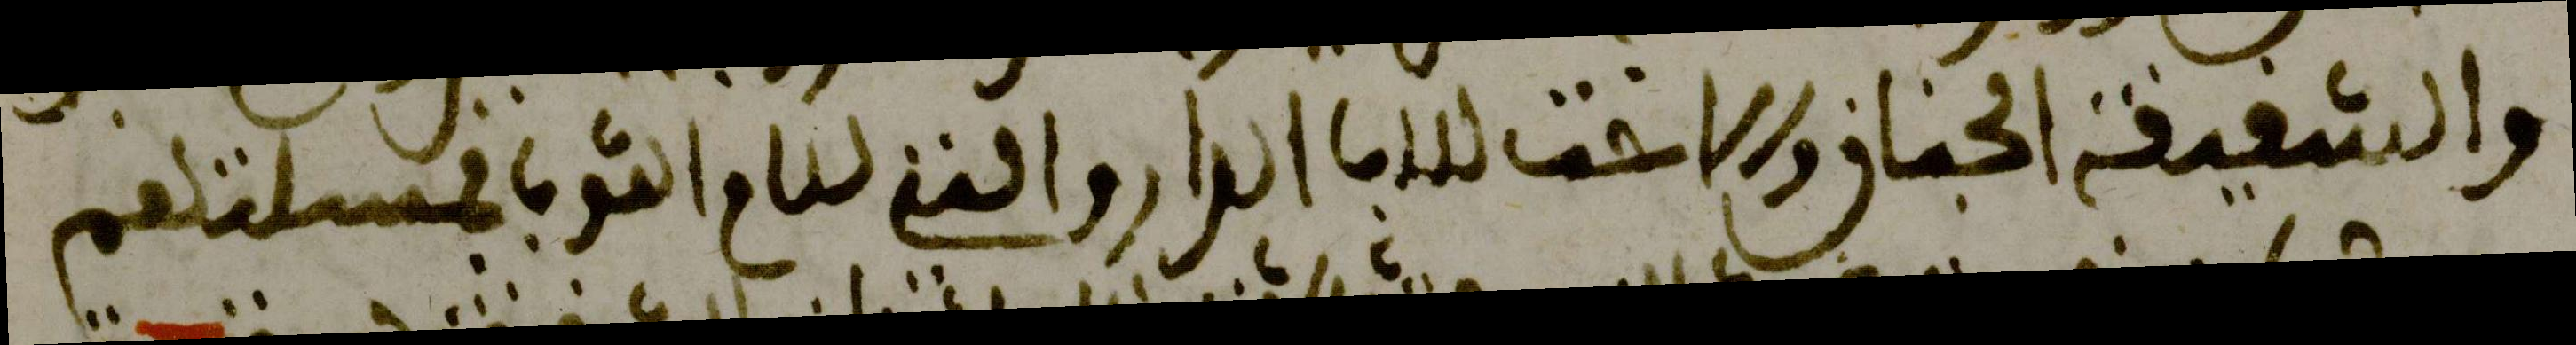والشقيقة الجنان والاخت للاب الدار والتي للام الثوب فمسلتهم
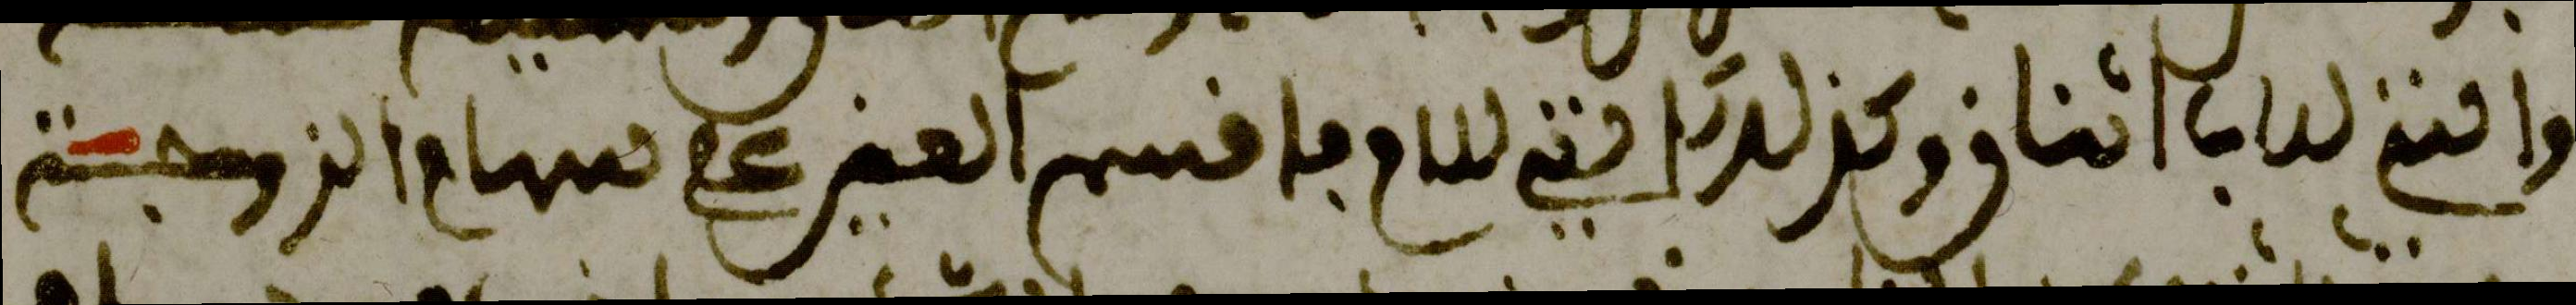والتي للاب اثنان وكذلك التي للام فاقسم العين على سهام الزوجَة
